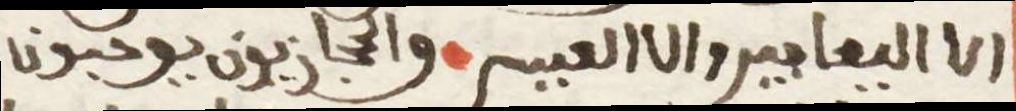الا اليعافير والا العيس والحجازيون يوحبون
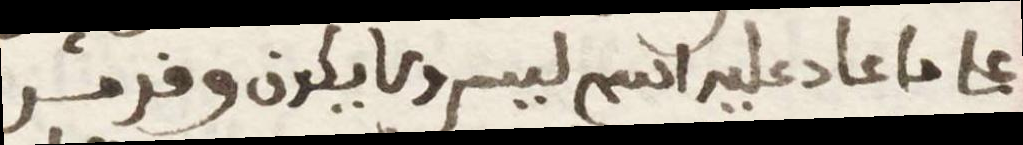على ما عاد عليه اسم ليس ولا يكون وقد مر
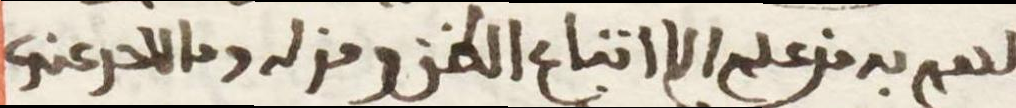لهم به من علم الا اتباع الظن وقوله وما لاحد عنده
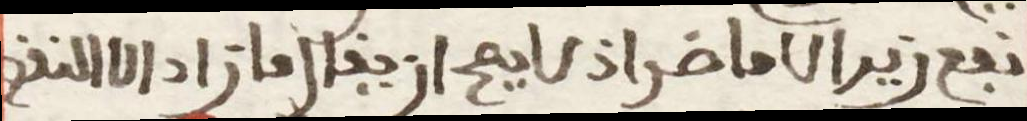نفع زيد الا ما ضر اذ لا يصح ان يقال ما زاد الا النفع
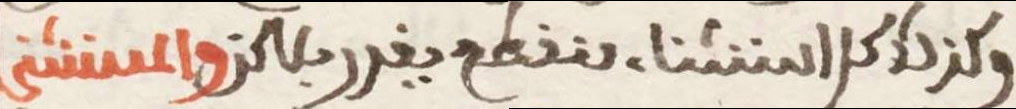وكذلك كل استثناء منقطع يقدر بلاكن والمستثنى
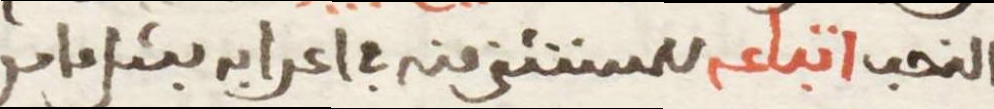النحب اتباعه للمستثنى منه في اعرابه بمثل ما مر
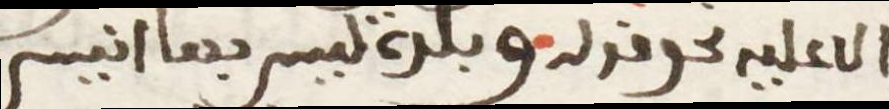الا عليه نحو قوله وبلدة ليس بها انيس
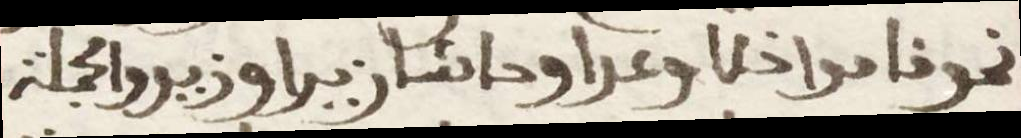نحو نادوا خلا وعدا وحاشا ويد وزيد والجملة
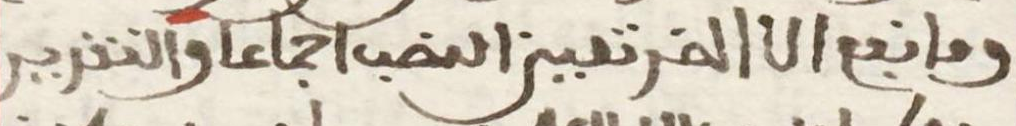وما نفع الا الضر تعين النضب اجماعا والتقدير
